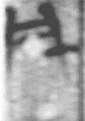凡
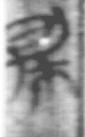車
